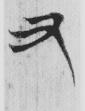又
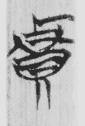貴
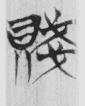賤
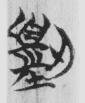{頁巠刃}
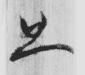也
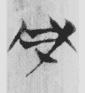凡
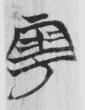𩁹
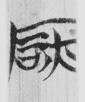庶
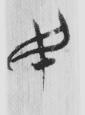民
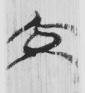交
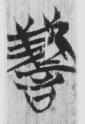{言疌}
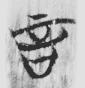言
